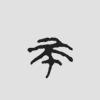不
